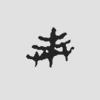奉
